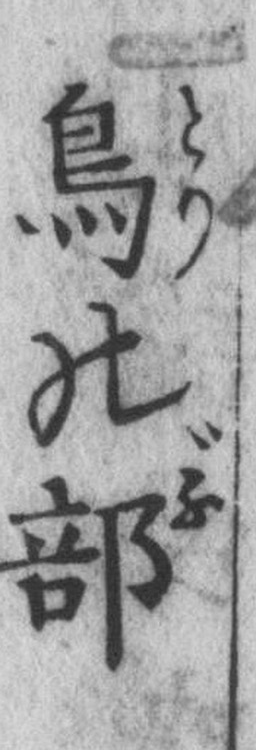鳥の部
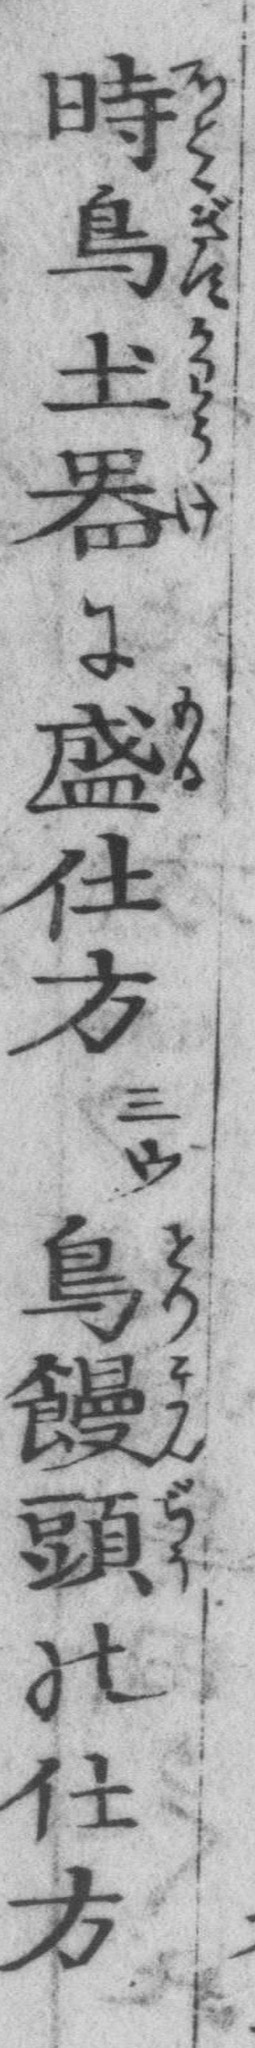時鳥土器に盛仕方三ウ鳥饅頭の仕方三ウ

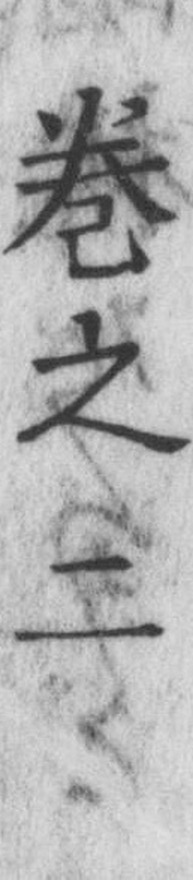巻之二
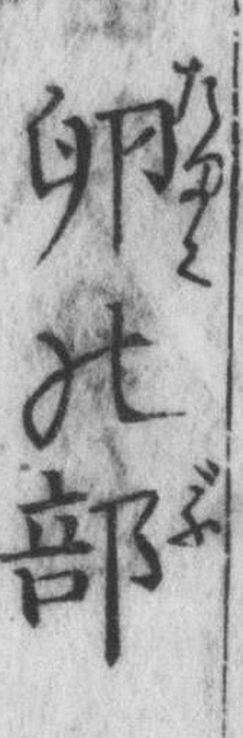卵の部

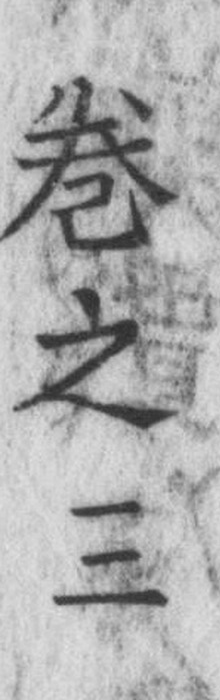巻之三
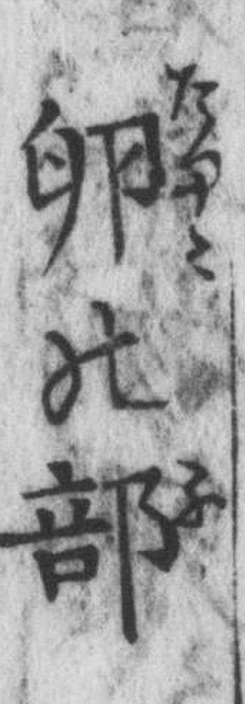卵の部

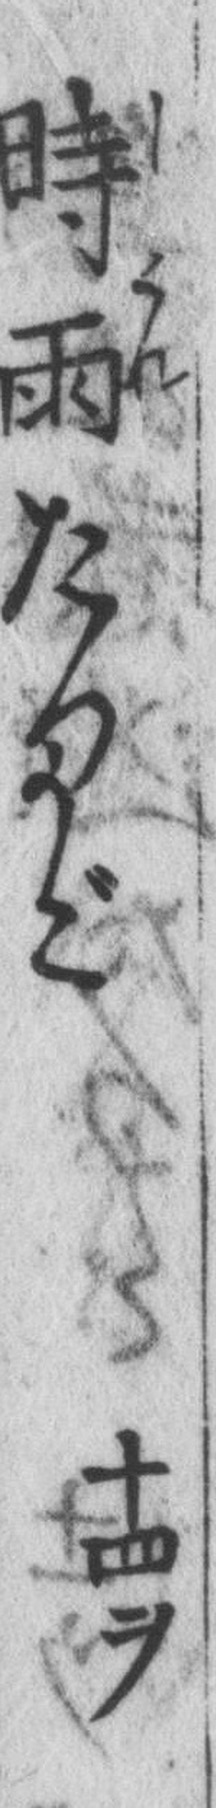時雨たまご十四ヲ
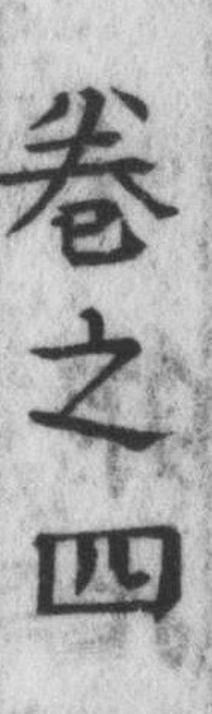巻之四
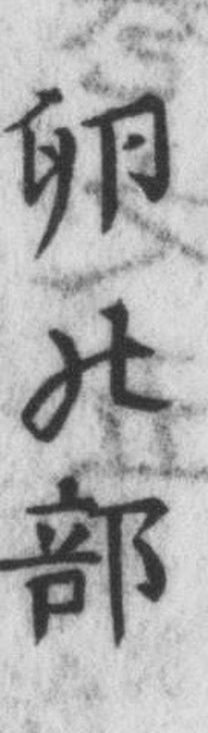卵の部
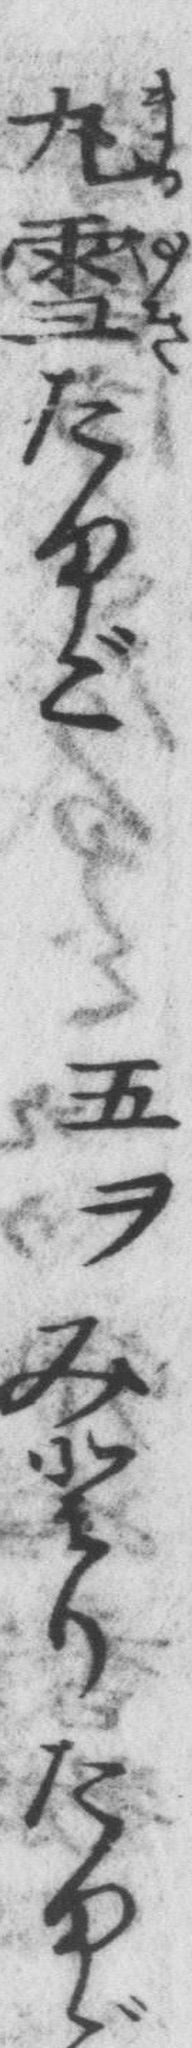丸雪たまご五ヲみとりたまご五ウ
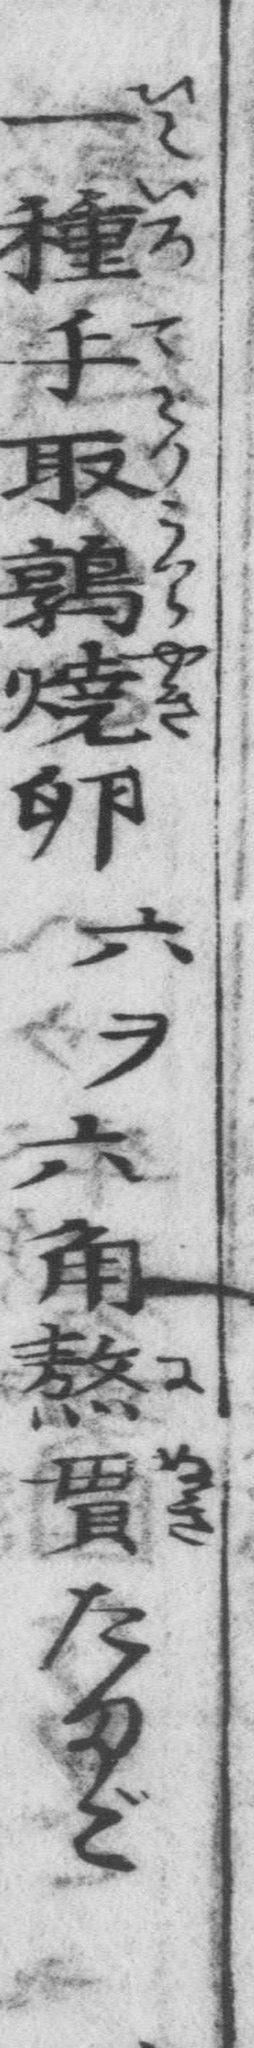一種手取鶉焼卵六ヲ六角熬貫たまご六ヲ
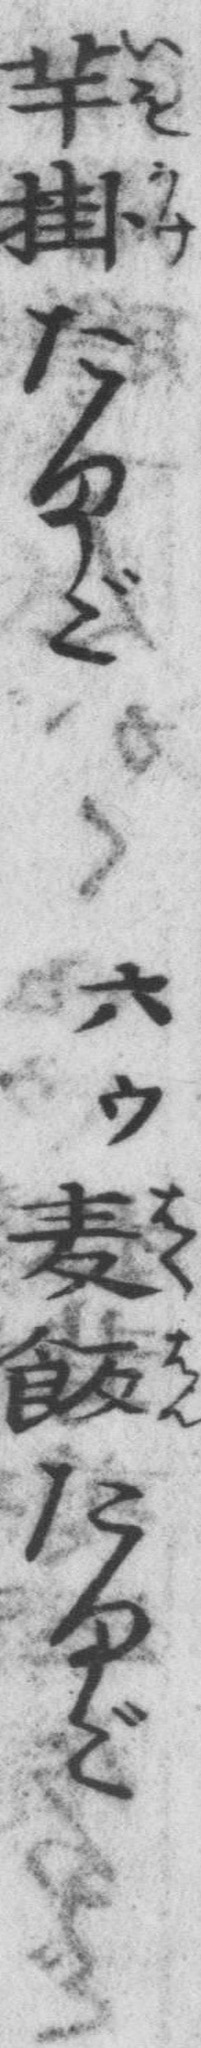芋掛たまご六ウ麦飯たまご七ヲ

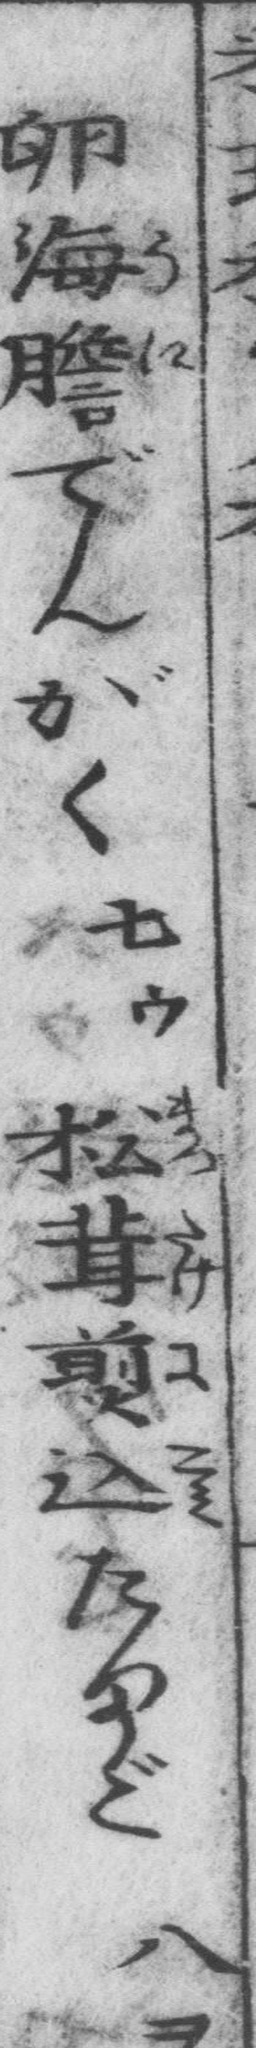卵海胆でんがく七ウ松茸煎込たまご八ヲ
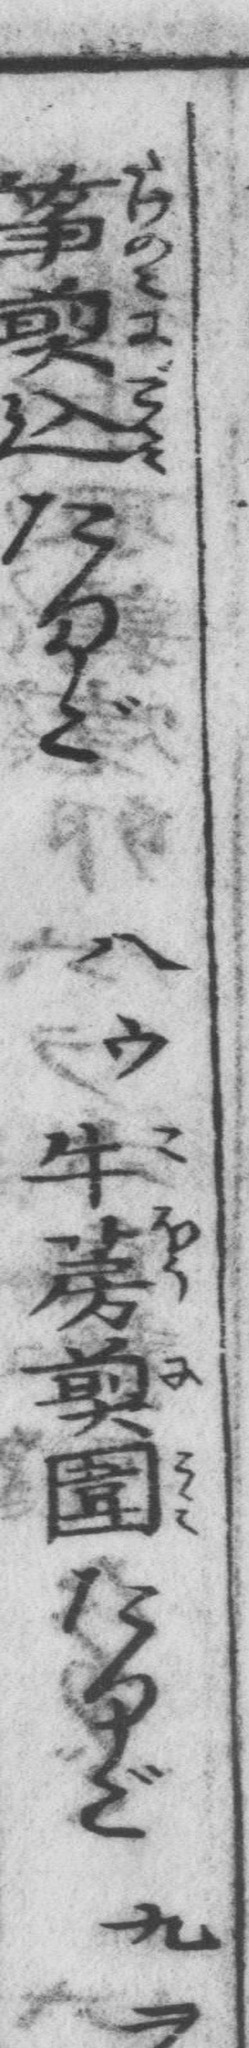笋煎込たまご八ウ牛房煎囲たまご九ヲ
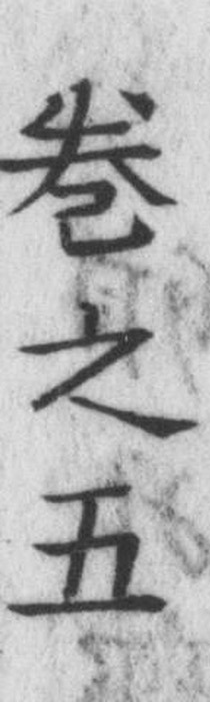巻之五
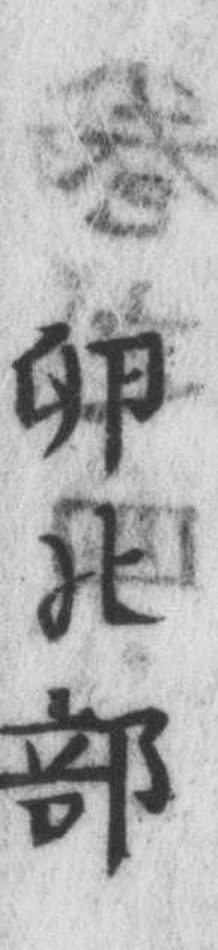卵の部
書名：萬寳料理秘密箱
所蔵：大阪府立大学学術情報センター 国文学研究資料館
